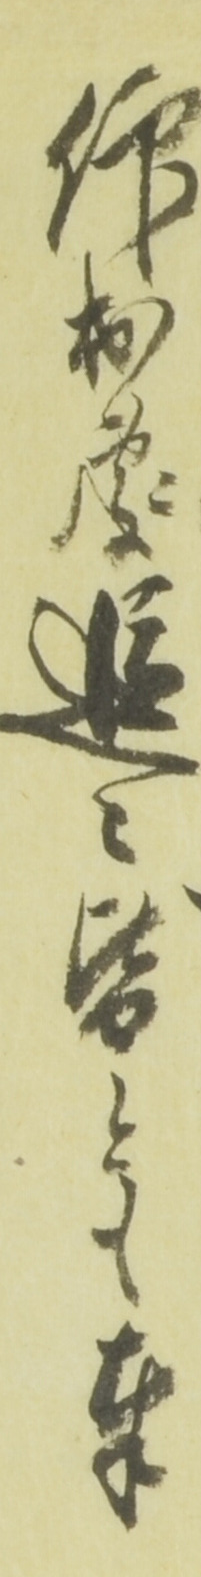仰出候追々皆とも奉
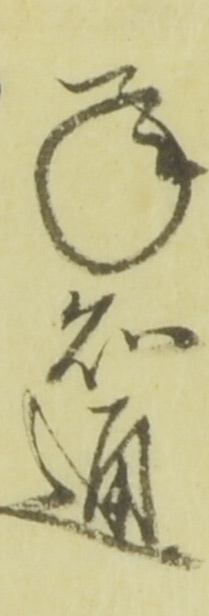承知通
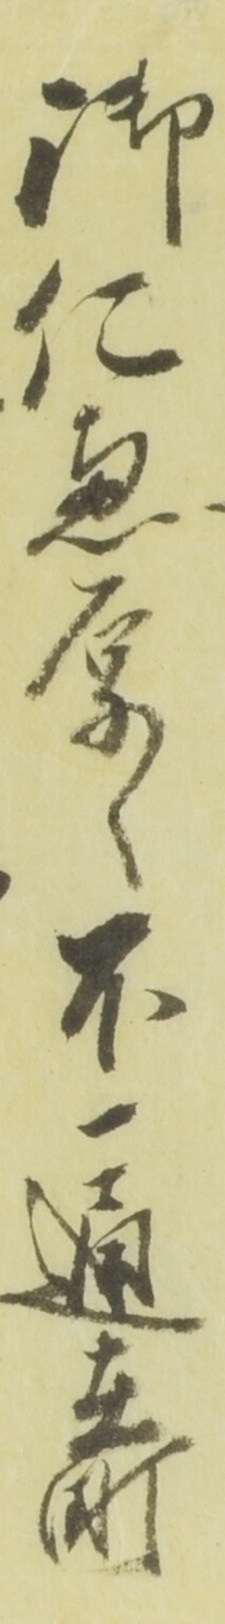御仁恵厚く不一通在町
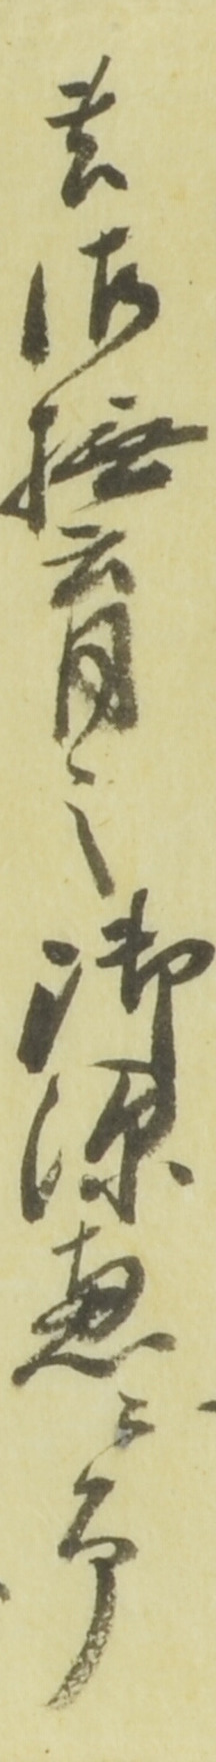共御撫育之御源恵ニ而
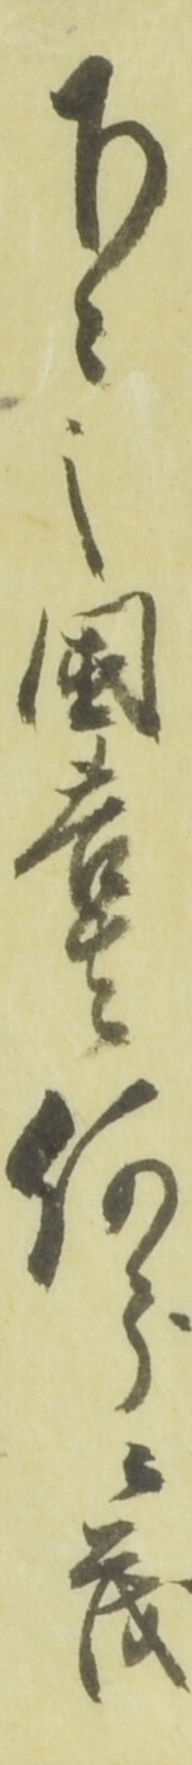下々之困苦は何分ニも
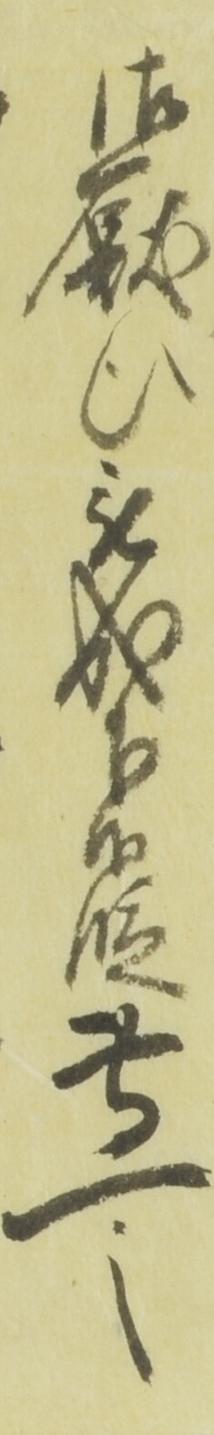御厭ひ被成下候段専一之
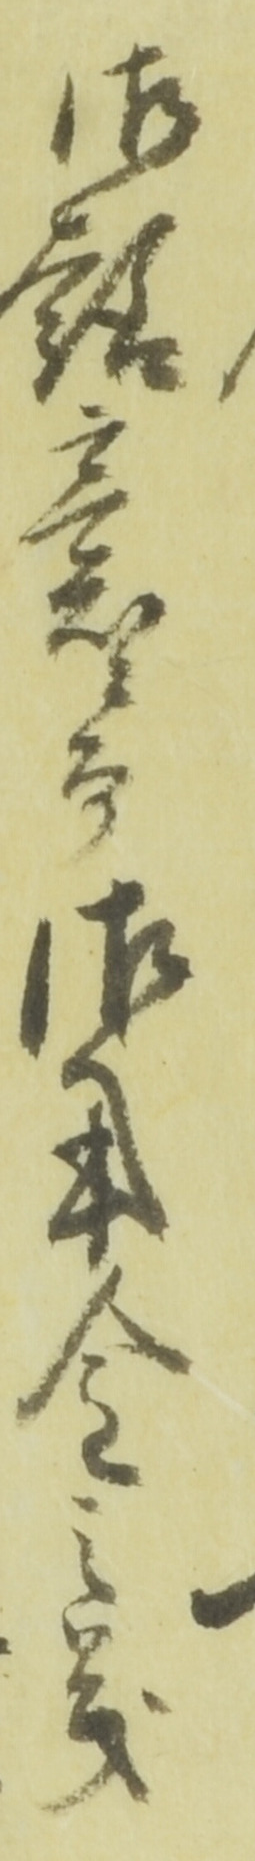御趣意ニ而御用金之義
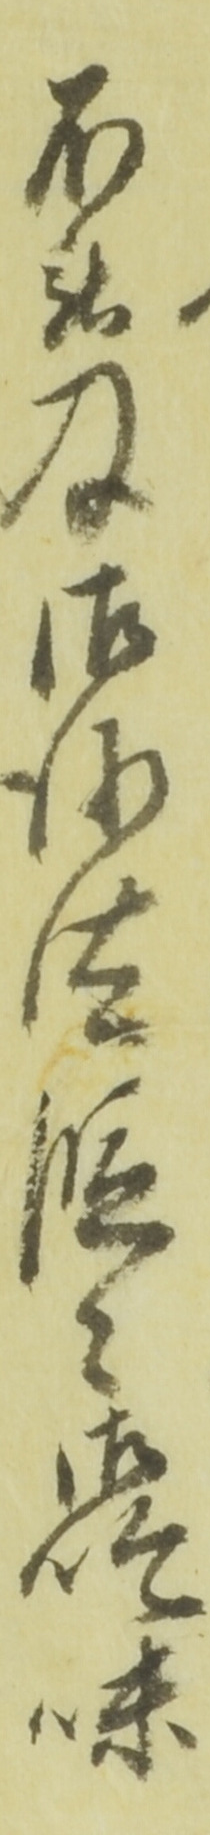不被及御沙汰段々御吟味
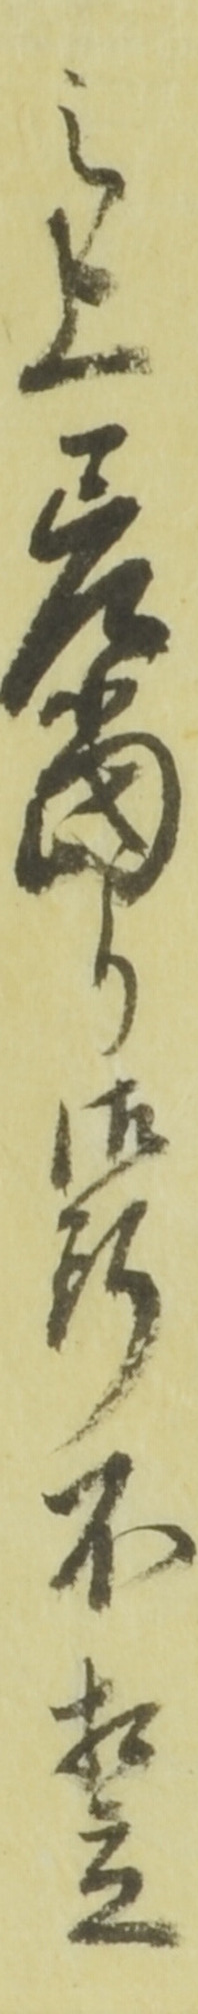之上差当り御断り不相立
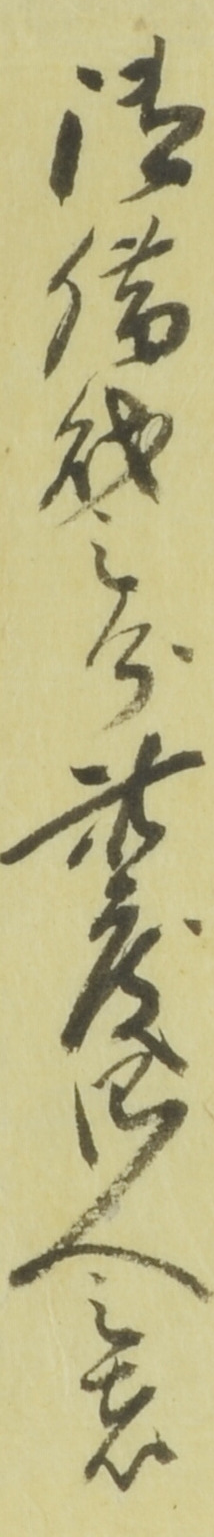御借財之分此度四人之者
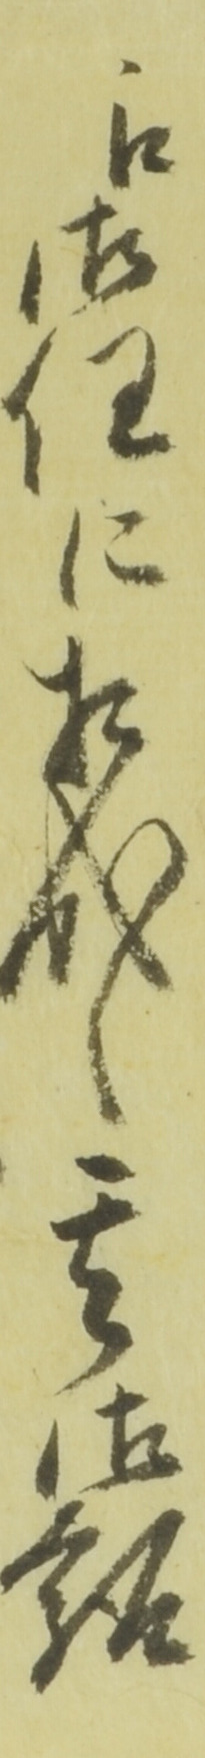江御任に相成候其御趣
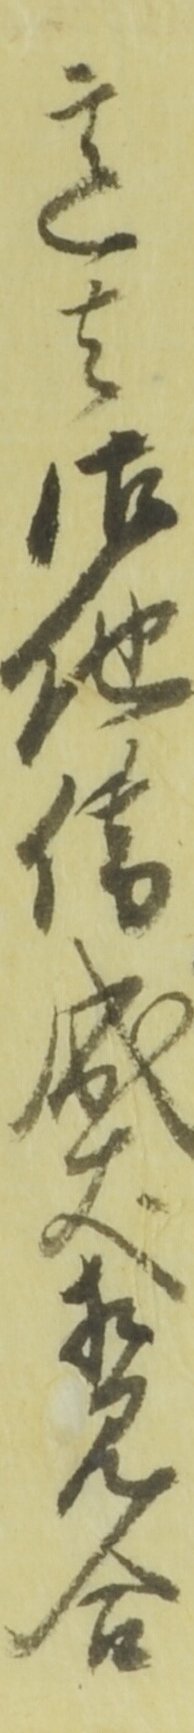意は御他借成丈相見合
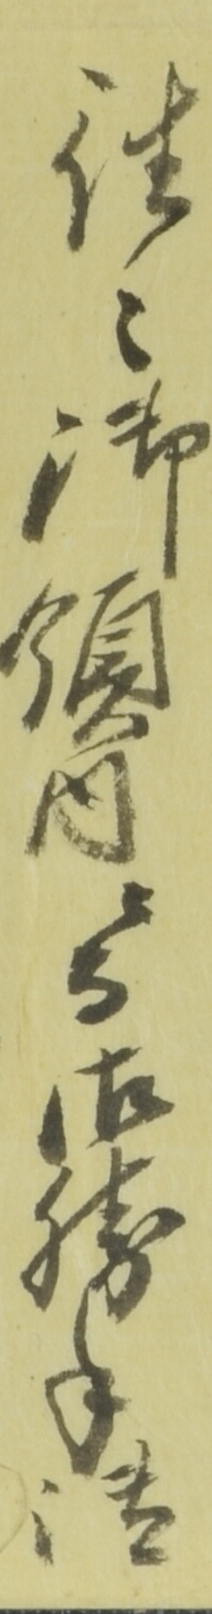往々御領内ニ而御勝手御
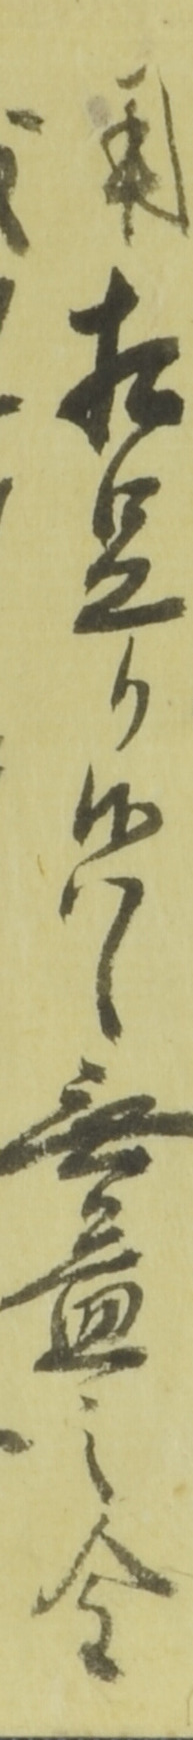用相足り候ハヽ無益之金
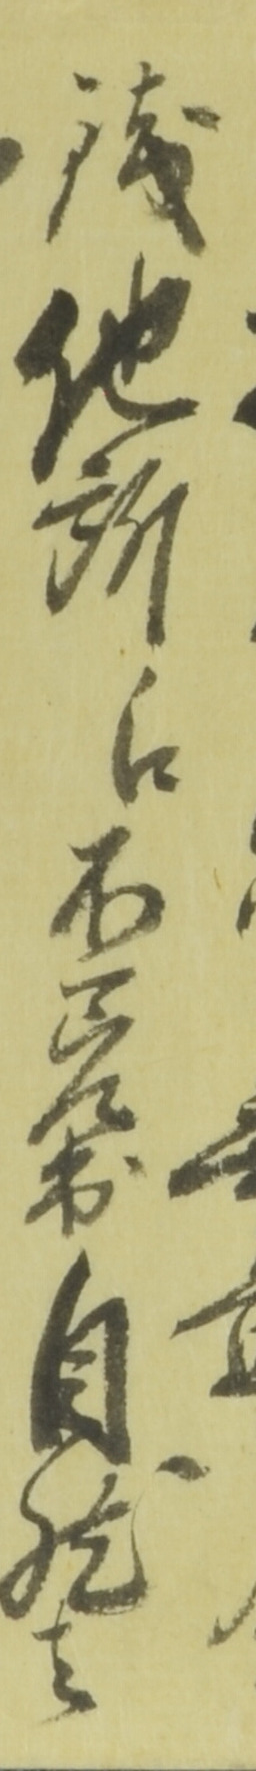銭他所江不差出自然は
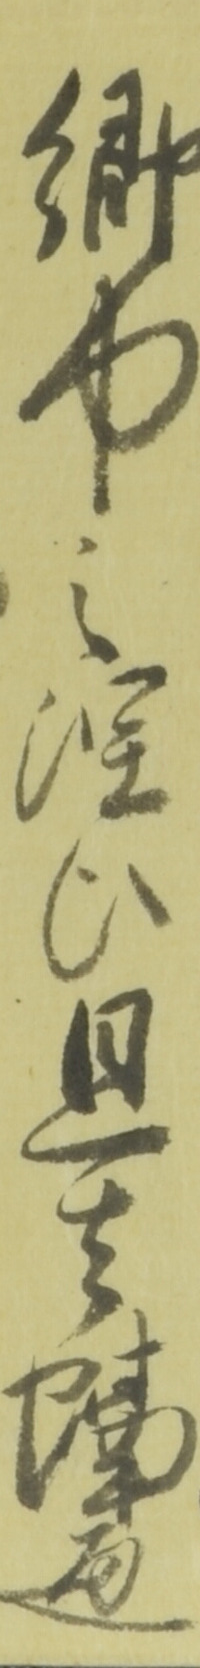郷中之潤ひ且は融通
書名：御触書御書附控
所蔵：伊那市立高遠町図書館・合同会社AMANE
